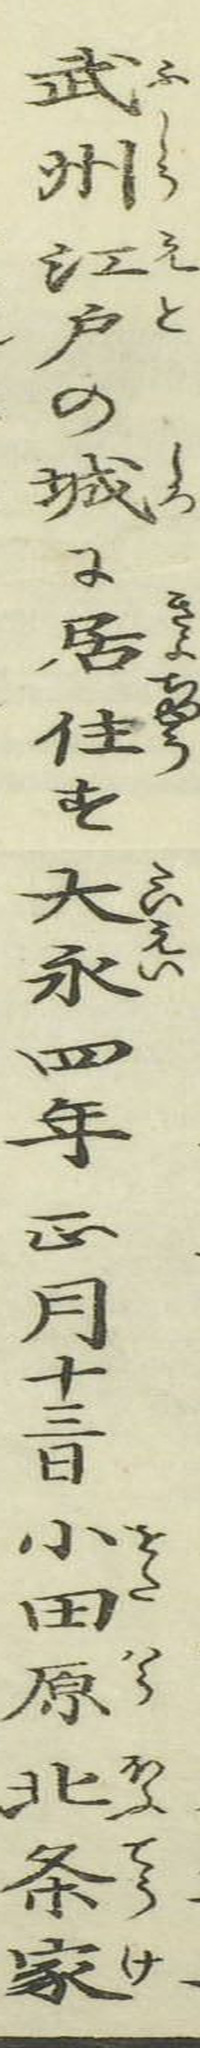武州江戸の城に居住す大永四年正月十三日小田原北条家
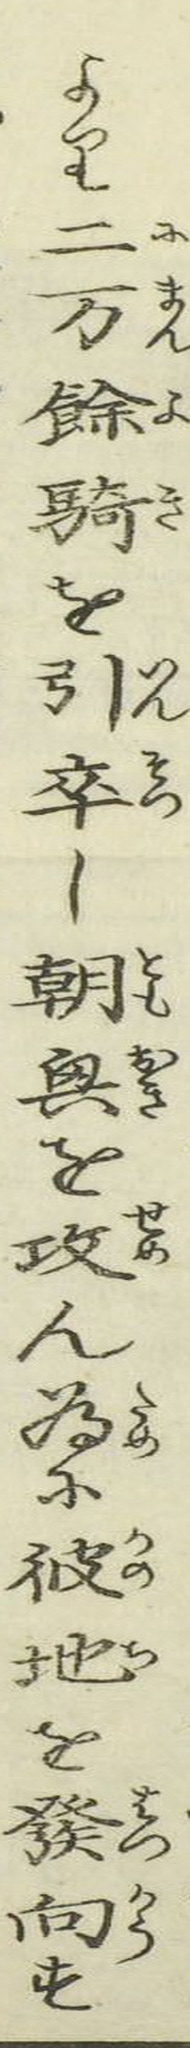より二万餘騎を引卒し朝興を攻ん為に彼地を發向す
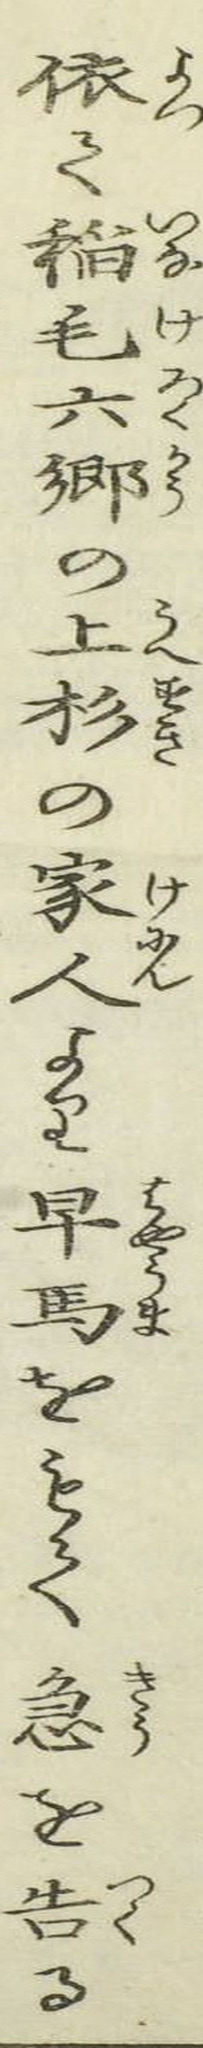依て稲毛六郷の上杉の家人より早馬をもて急を告る
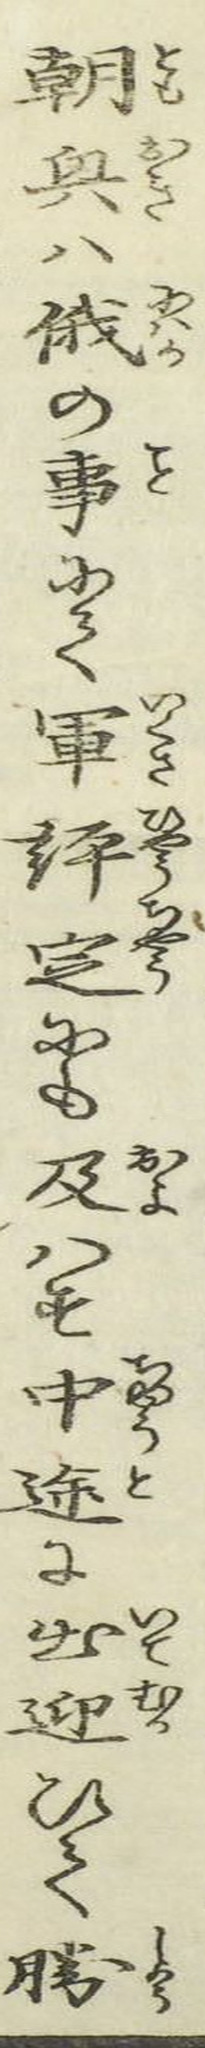朝興は俄の事にて軍評定にも及はす中途に出迎ひて勝
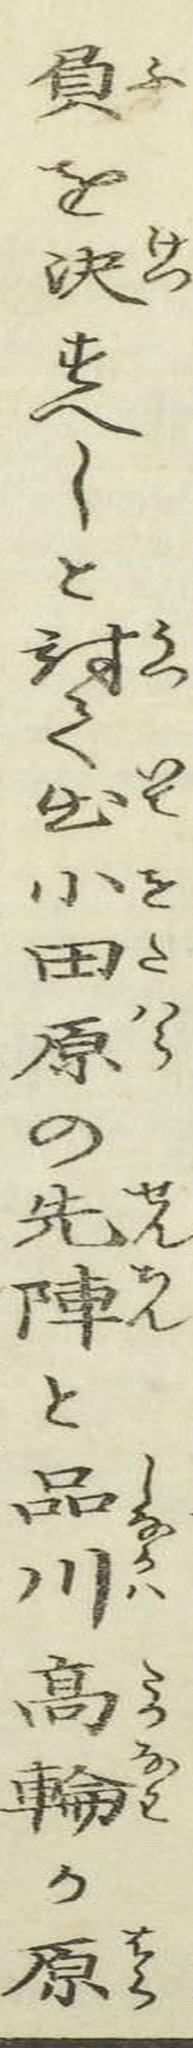負を決すへしと討て出小田原の先陣と品川高輪ゕ原
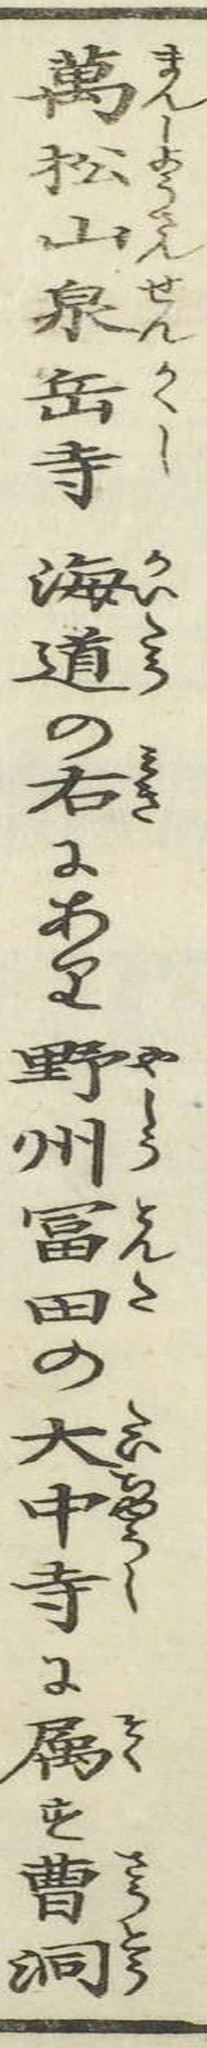萬松山泉岳寺海道の右にあり野州冨田の大中寺に属す曹洞
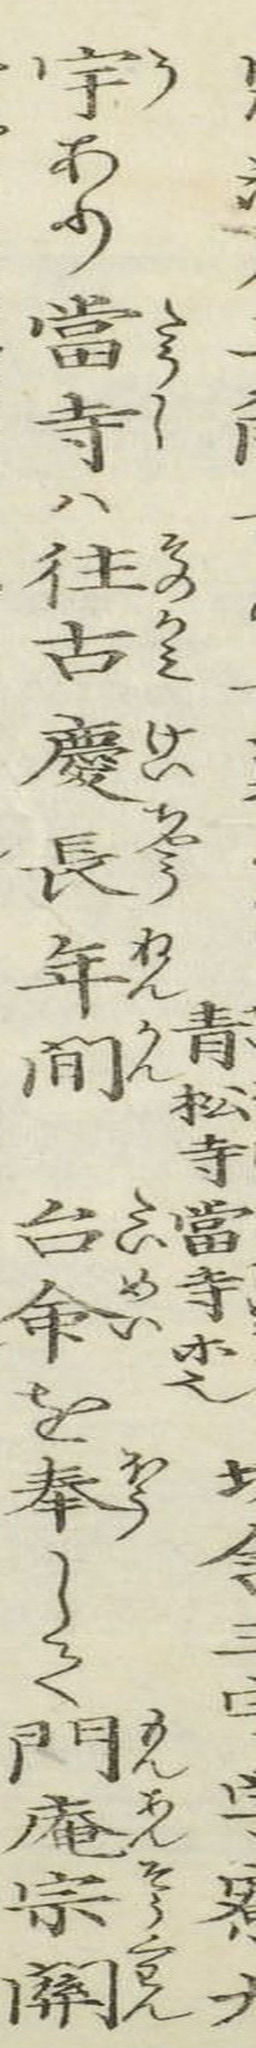宇あり當寺は往古慶長年間台命を奉して門庵宗関
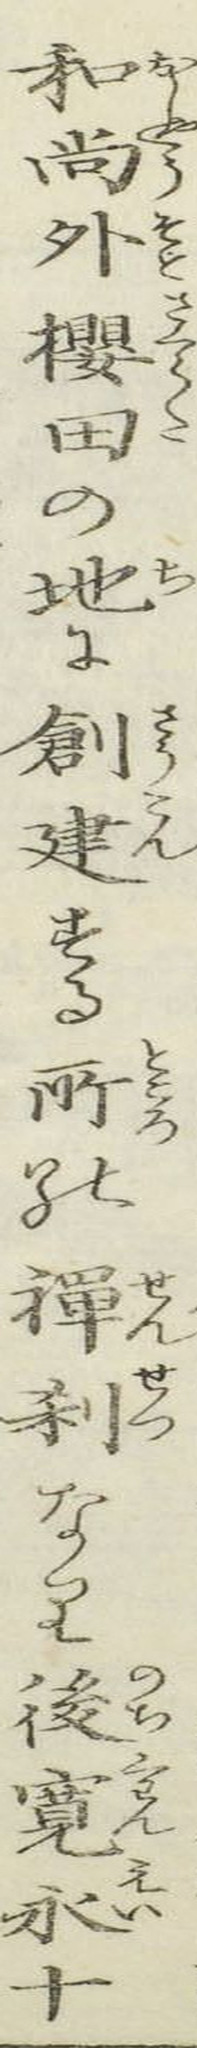和尚外櫻田の地に創建する所の禅刹なり後寛永十
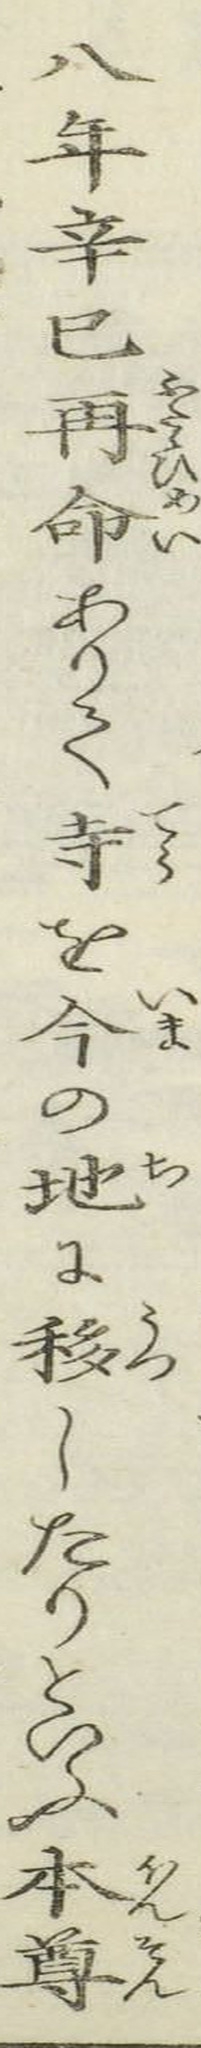八年辛巳再命ありて寺を今の地に移したりといふ本尊
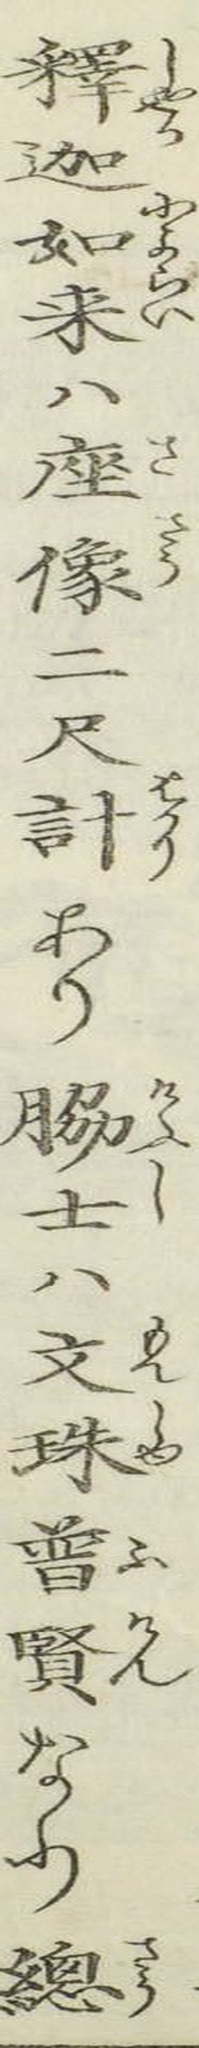釈迦如来は座像二尺計あり脇士は文珠普賢なり総
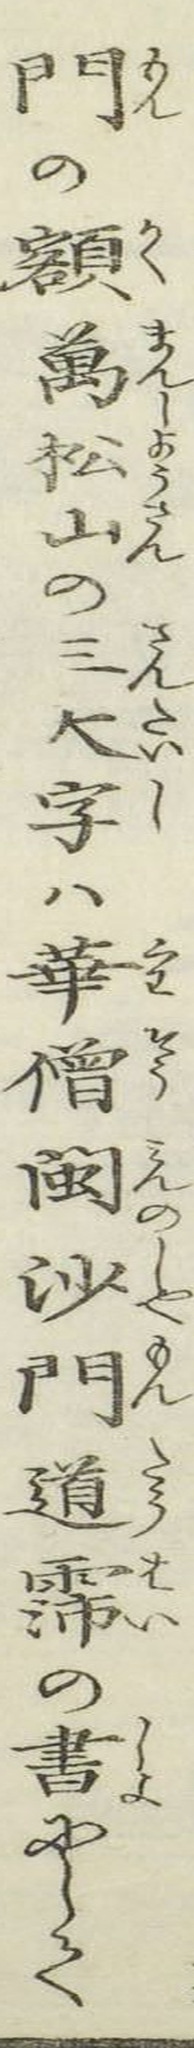門の額萬松山の三大字は華僧閩沙門道霈の書にして
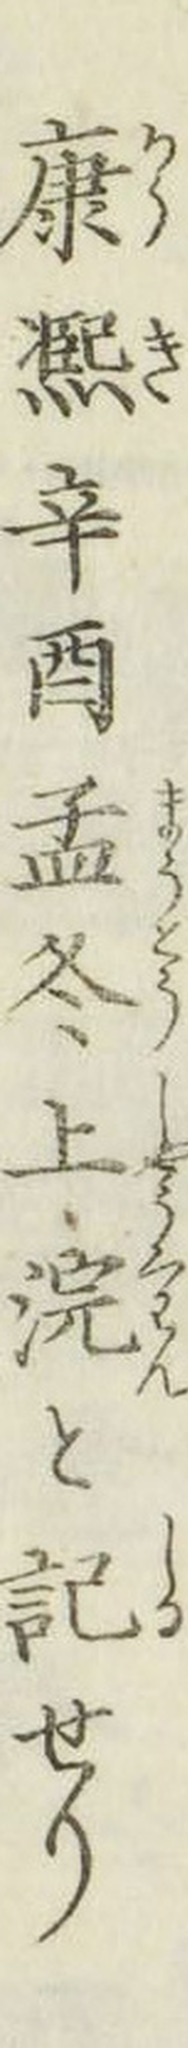康熙辛酉孟冬上浣と記せり
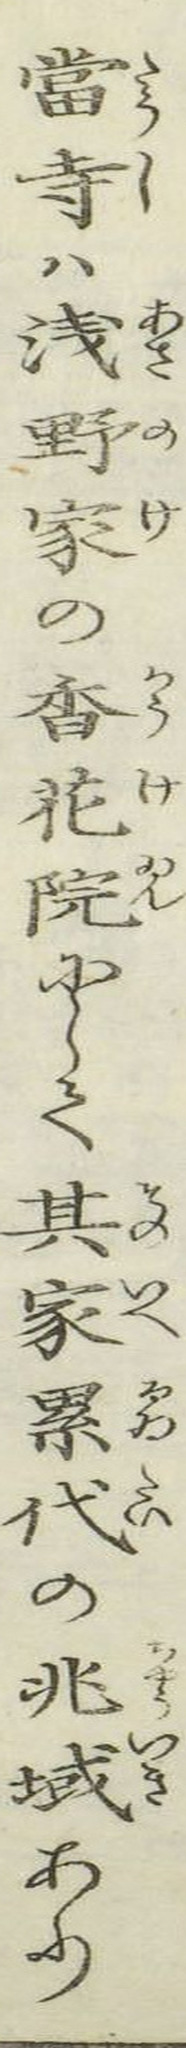當寺は浅野家の香花院にして其家累代の兆域あり
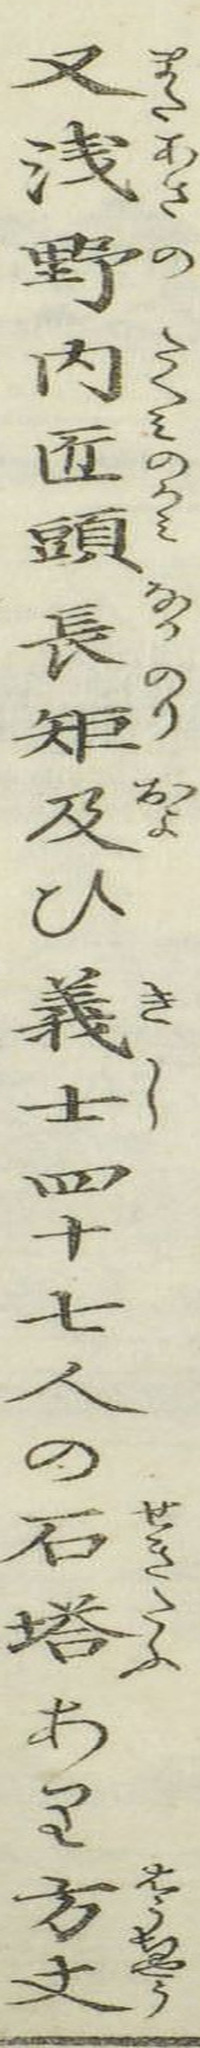又浅野内匠頭長矩及ひ義士四十七人の石塔あり方丈
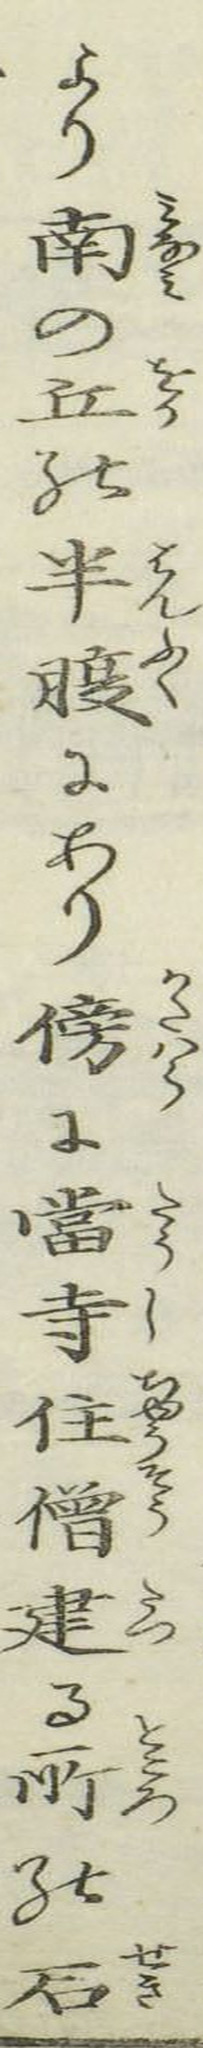より南の丘の半腹にあり傍に當寺住僧建る所の石
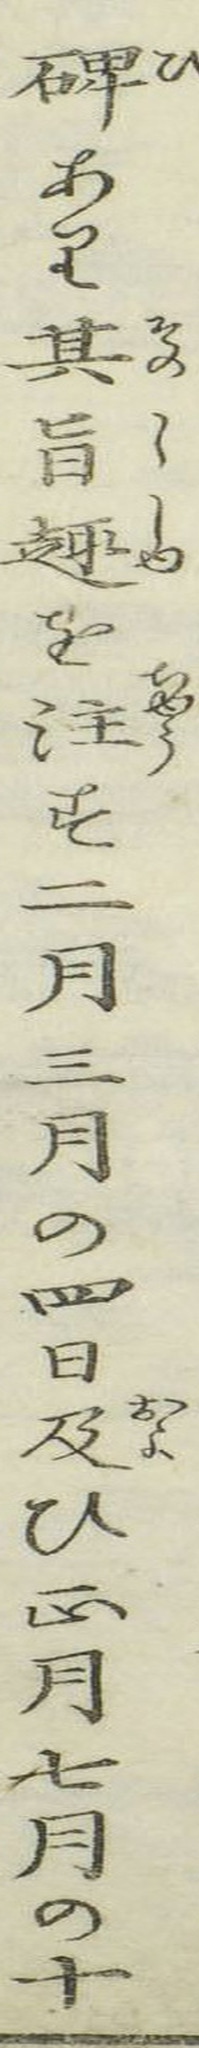碑あり其旨趣を注す二月三月の四日及ひ正月七月の十
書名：江戸名所図会 20巻 巻之3
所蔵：東京学芸大学教育コンテンツアーカイブ
